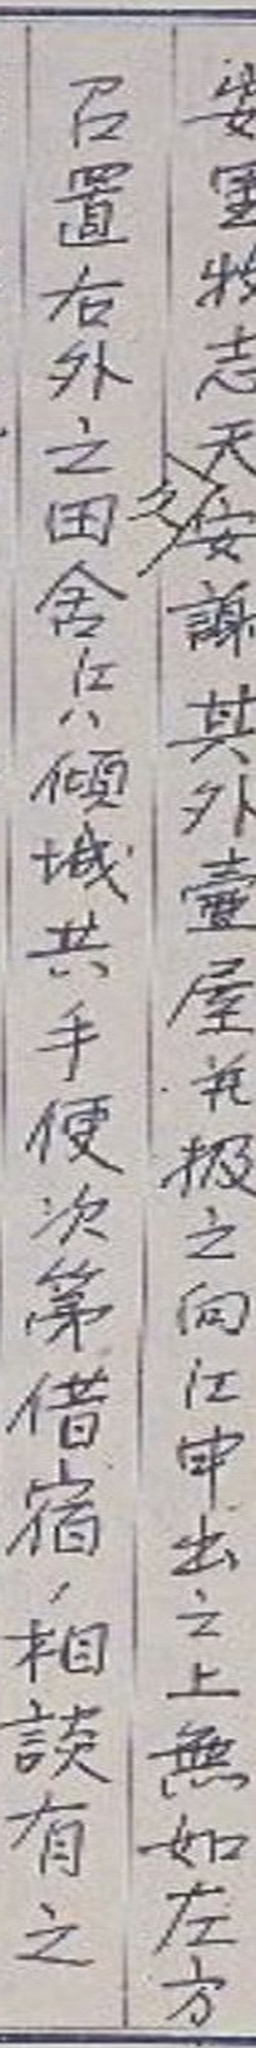召置右外之田舎えは傾城共手便次第借宿の相談有之
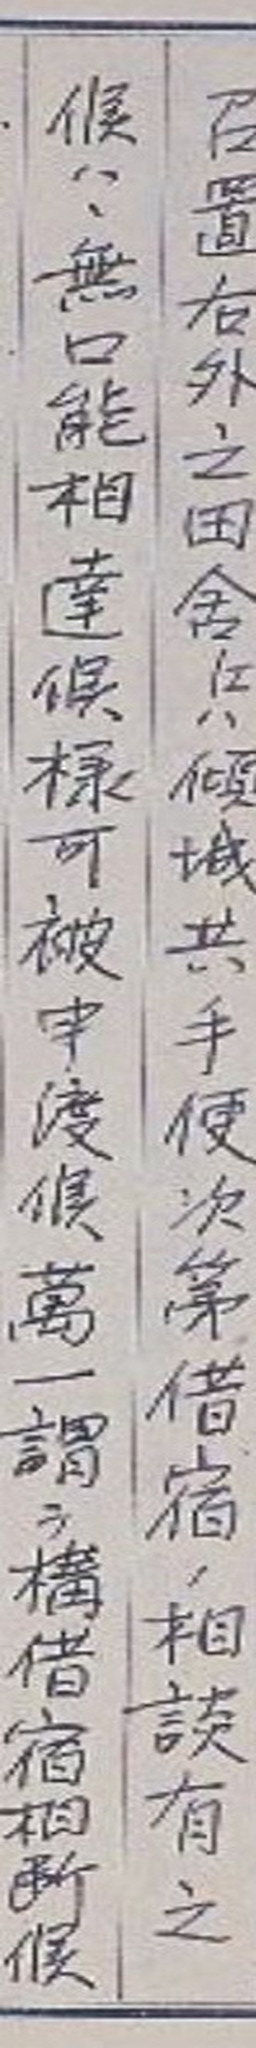候はゝ無口能相達候様可被申渡候万一謂う構借宿相断候
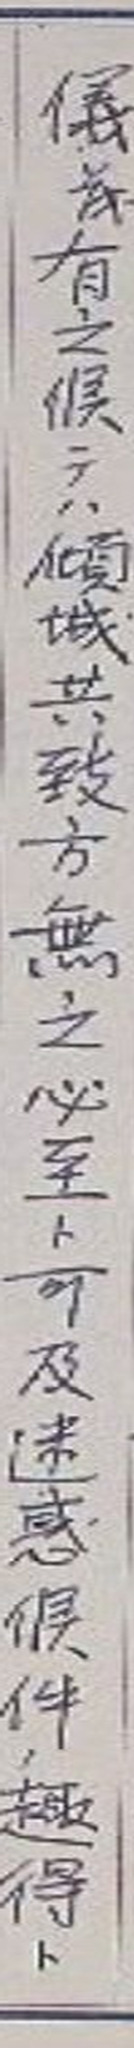儀も有之候ては傾城共致方無之必至と可及迷惑候件の趣得と
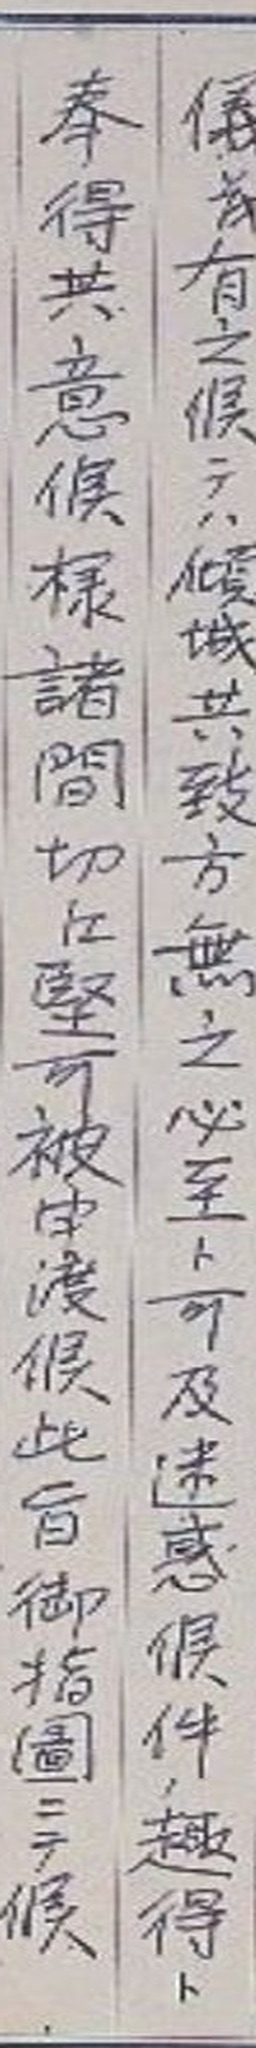奉得其意候様諸間切え堅可被申渡候此旨御指図にて候
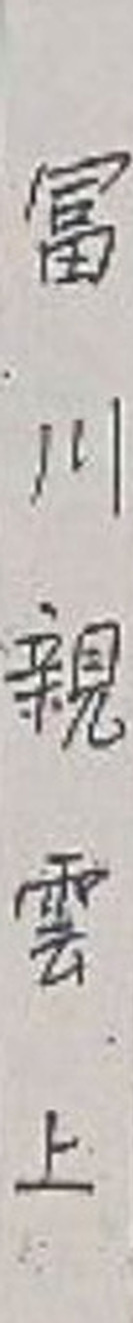古堅親雲上
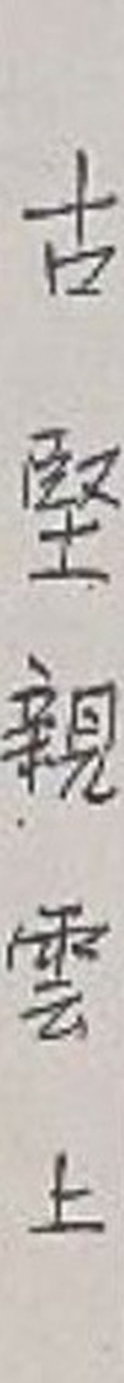古堅親雲上
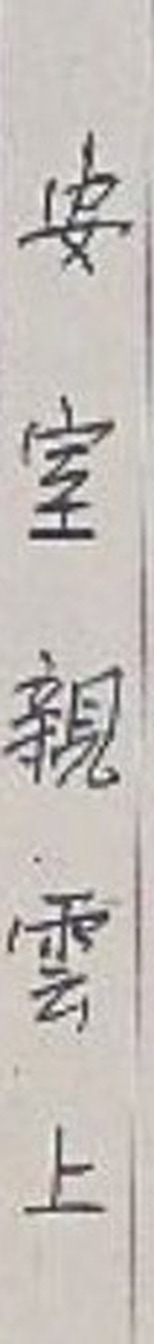安室親雲上
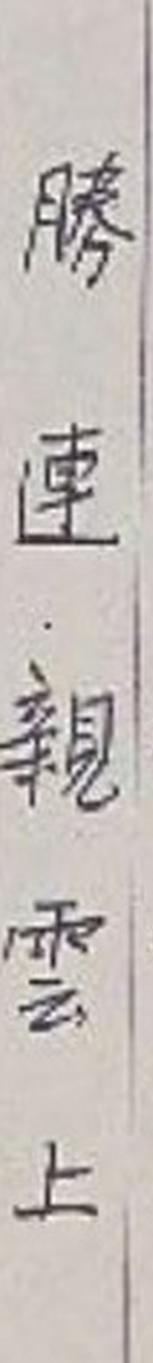勝連親雲上
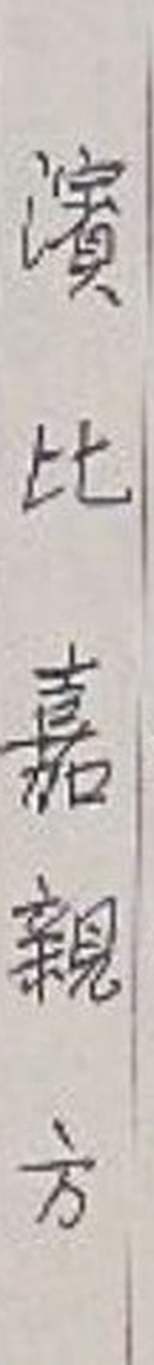浜比嘉親方
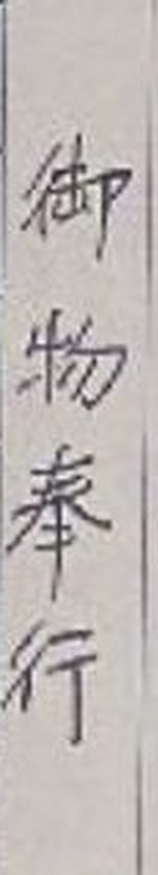御物奉行
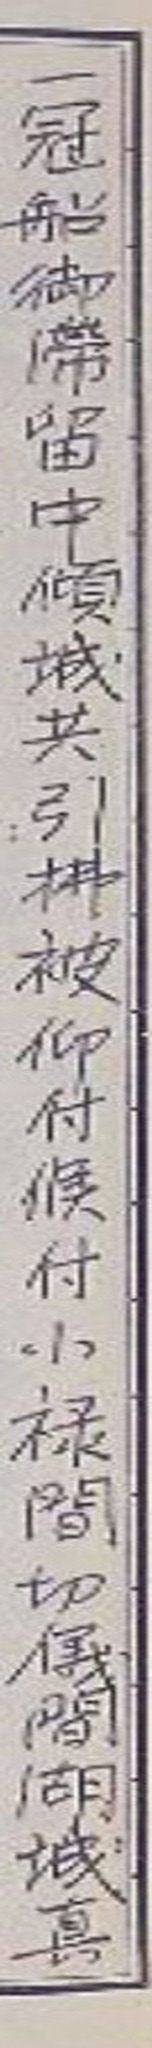一冠船御滞留中傾城共引払被仰付候付小禄間切儀間湖城真
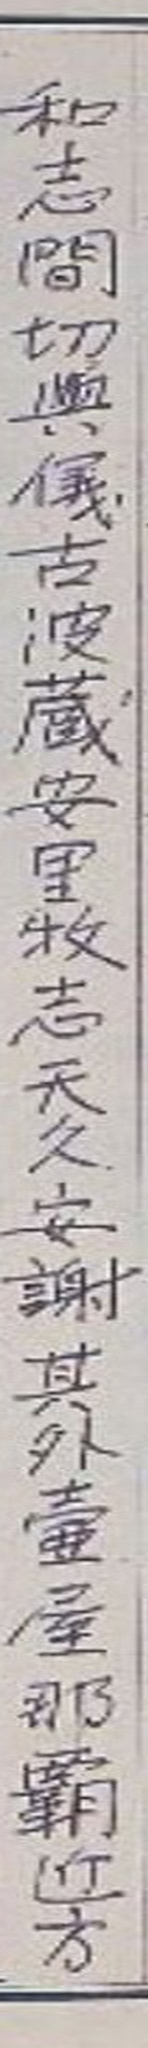和志間切与儀古波蔵安里牧志天久安謝其外壺屋那覇近方
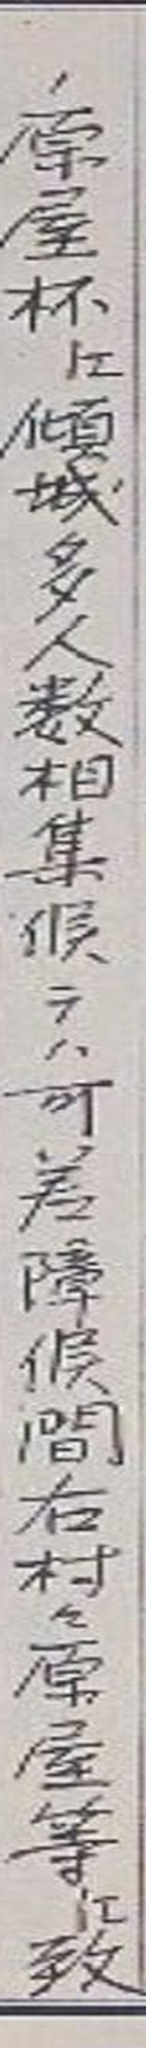の原屋抔え傾城多人数相集候ては可差障候間右村々原屋等え致
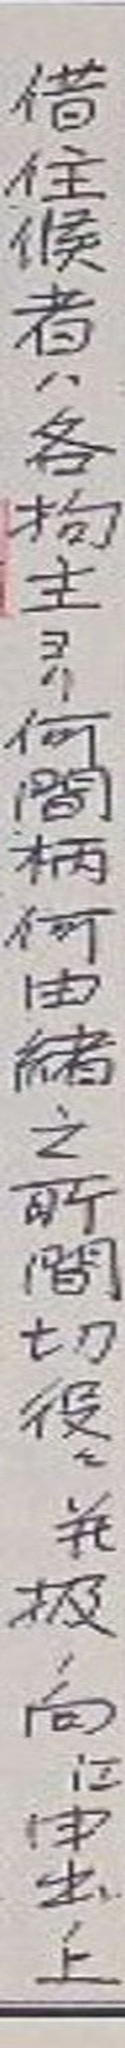借住候者は各拘主より何間柄何由緒之所間切役々并扱の向え致
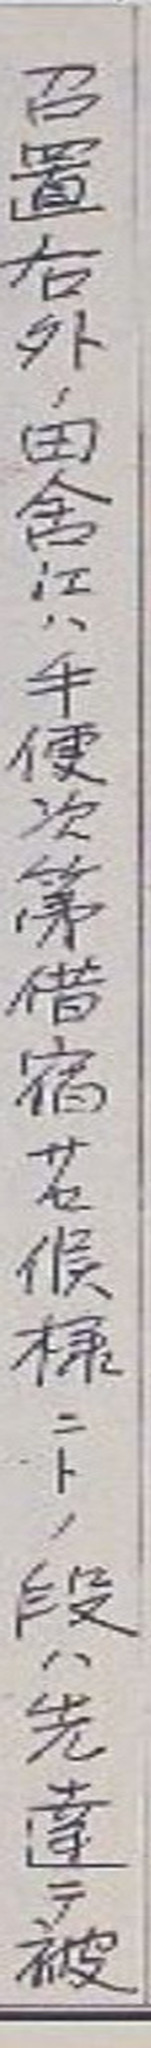召置右外の田舎えは手便次第借宿させ候様にとの段は先達て被
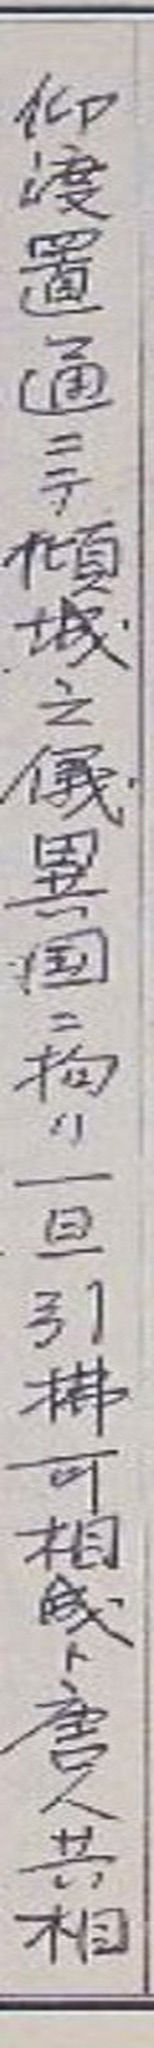仰渡置通にて傾城之儀異国に拘り一旦引払可相成と唐人共相
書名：支那冊封使来琉諸記 下巻
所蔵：University of the Ryukyus Library
